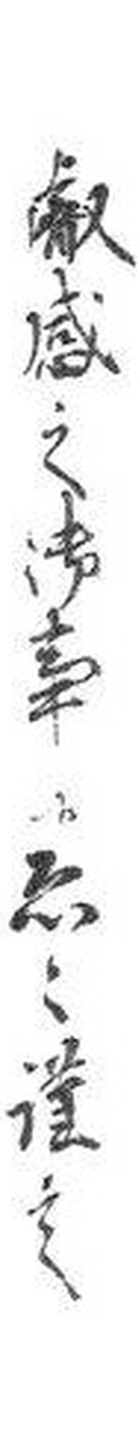叡感之御事候恐々謹言
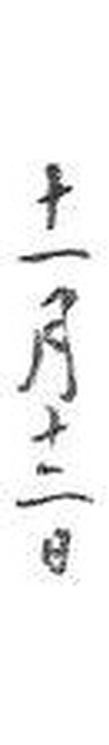十一月十二日
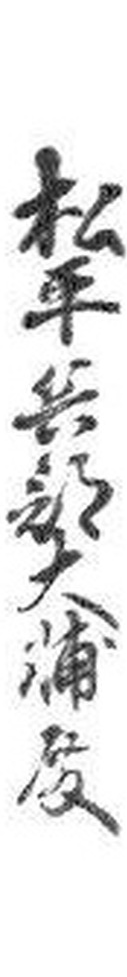松平兵部大輔殿
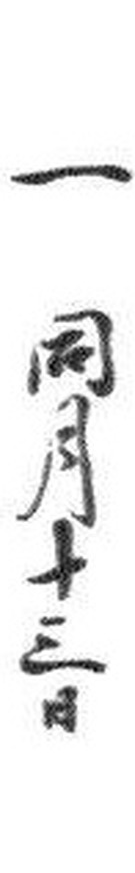一同月十三日
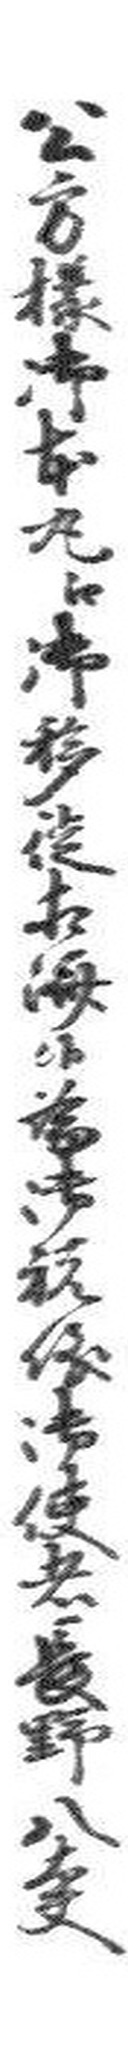公方様御本丸江御移徙相済候為御祝儀御使者長野八太夫
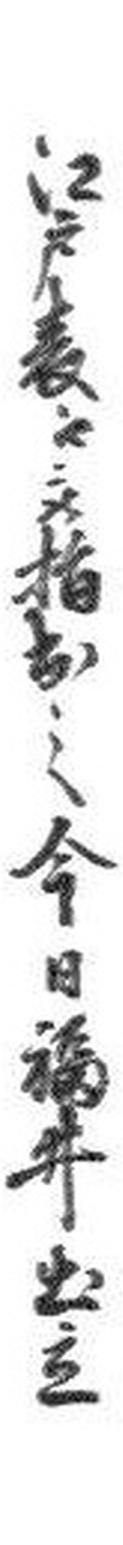江戸表江被指出之今日福井出立
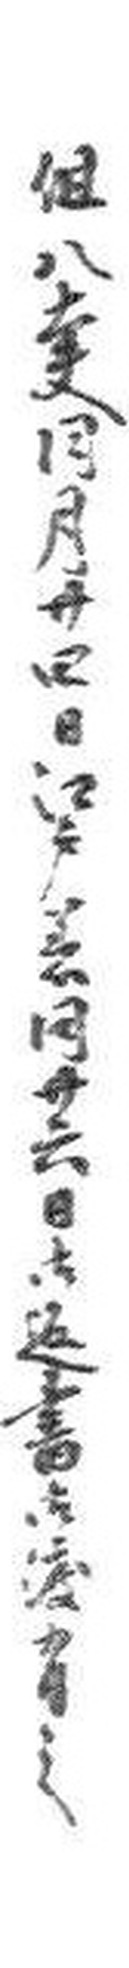但八太夫同月廿四日江戸着同廿六日御返書御渡有之
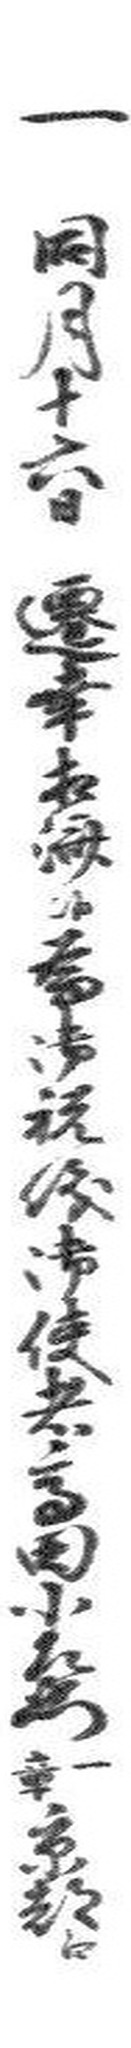一同月十六日遷幸相済候為御祝儀御使者高田小左衛門一章京都江
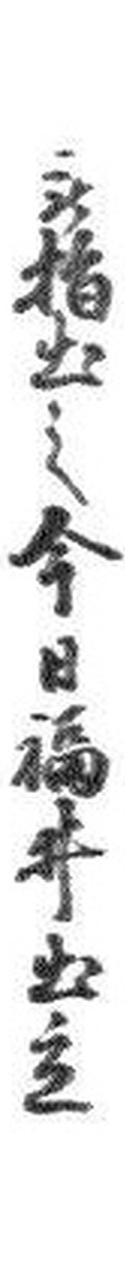被指出之今日福井出立
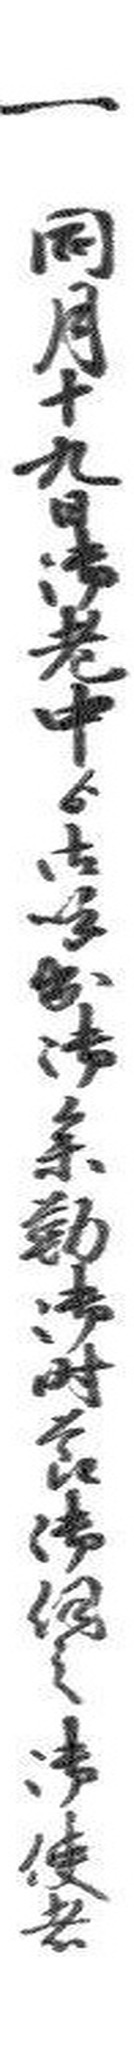一同月十九日御老中ゟ御呼出御参勤御時節御伺之御使者
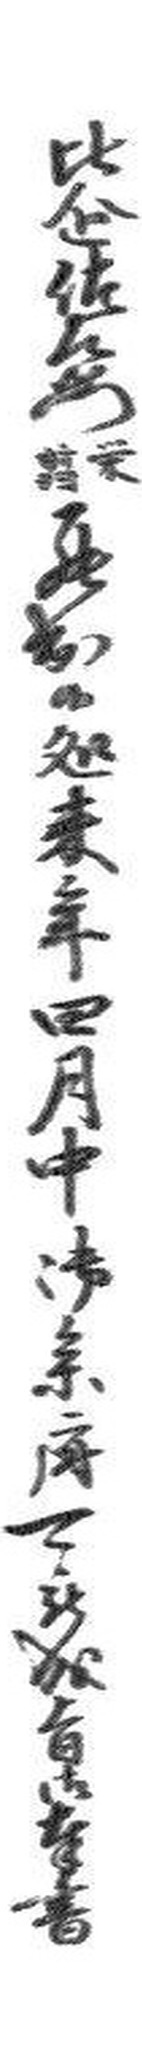比企佐左衛門栄翦罷出候処来年四月中御参府可被成旨御奉書
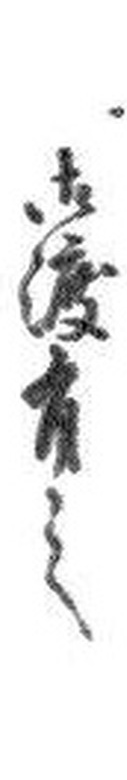御渡有之

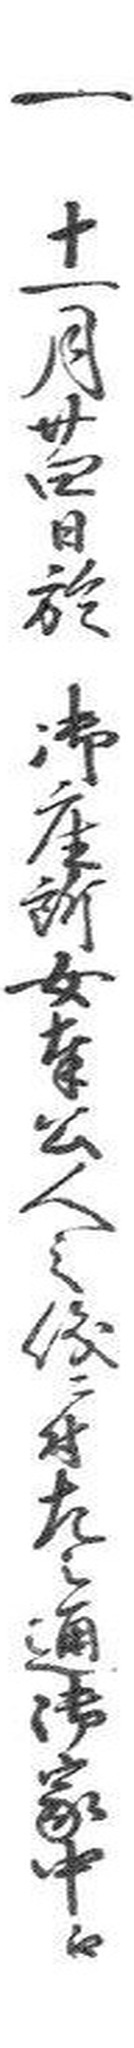一十一月廿四日於御座所女奉公人之儀ニ付左之通御家中江
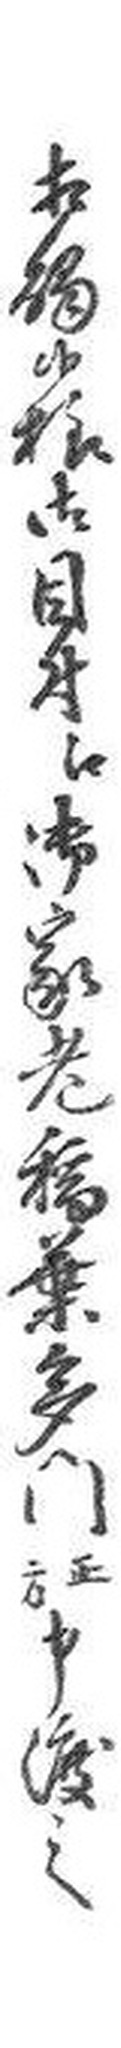御触候様御目付江御家老稲葉多門正方申渡之
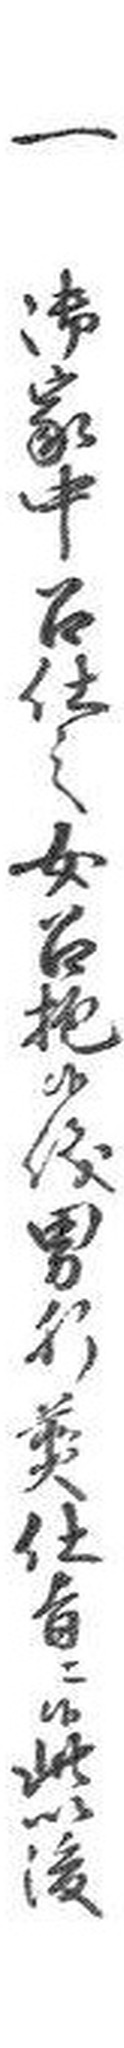一御家中召仕之女召抱候儀男肝煎仕旨ニ候此以後
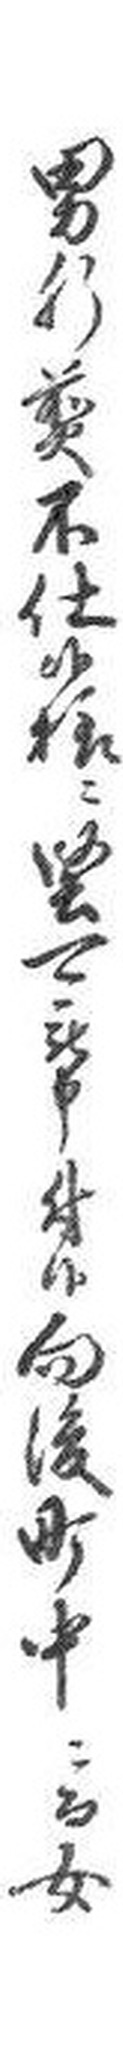男肝煎不仕候様ニ堅可被申付候向後町中ニ而女
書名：家譜 二十五 吉品公 従宝永六年到同七年
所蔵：福井県文書館 Fukui Prefectural Archives
